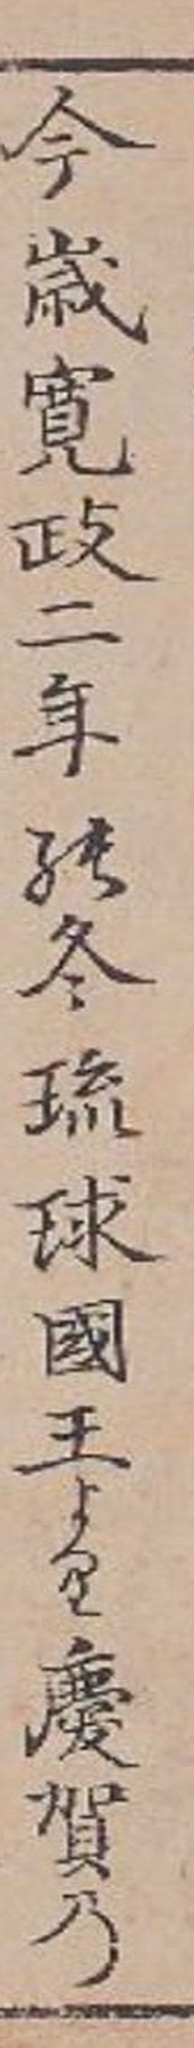今歳寛政二年の冬琉球国王より慶賀の
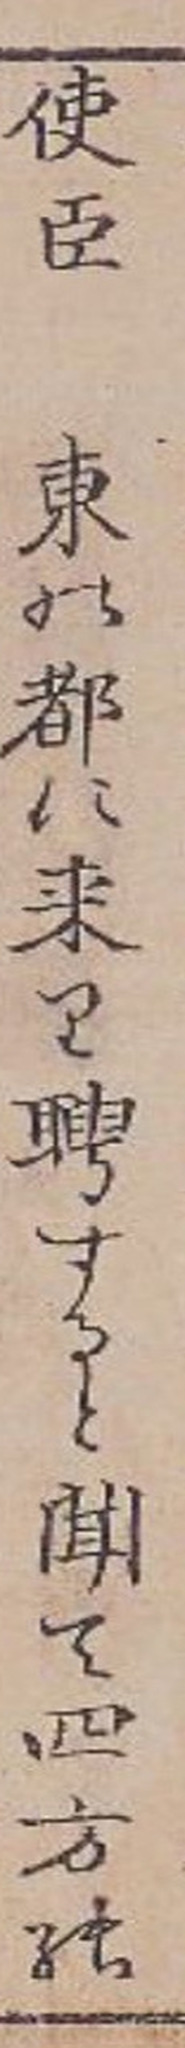使臣東の都に来り聘すると聞て四方の
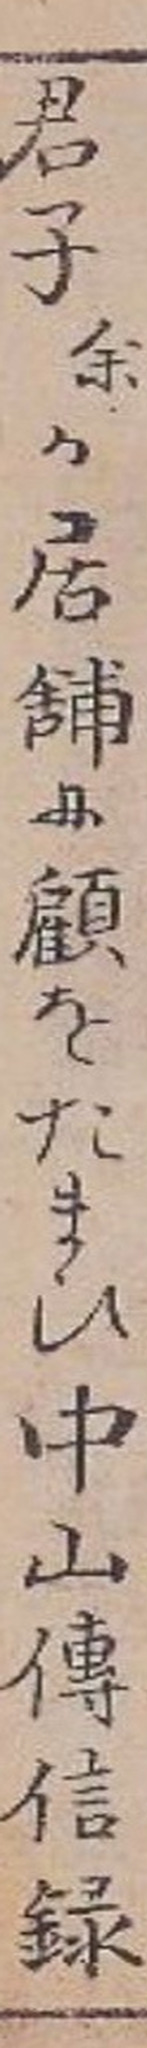君子余か居舗に顧をたまひ中山伝信録
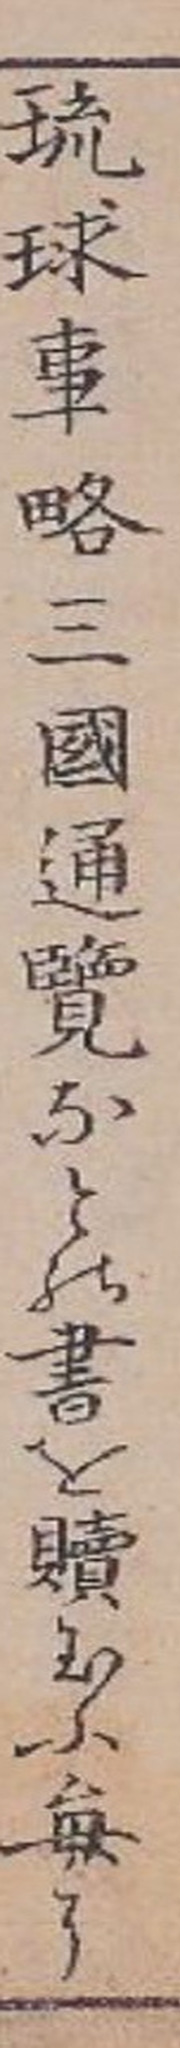琉球事略三国通覧なとの書を贖玉ふ毎に
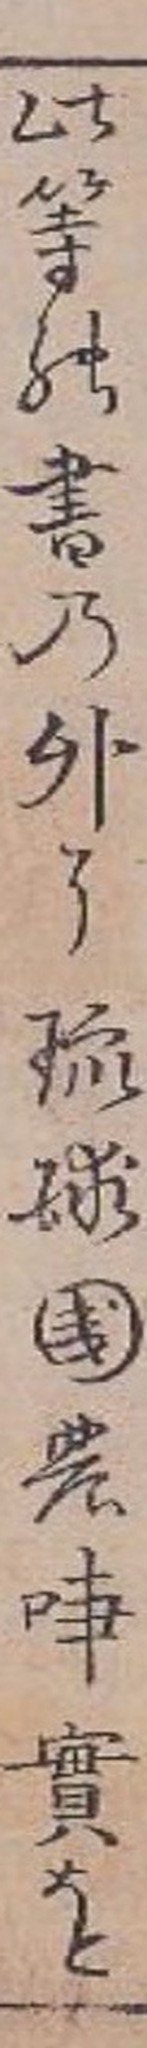此等の書の外に琉球国の事実を
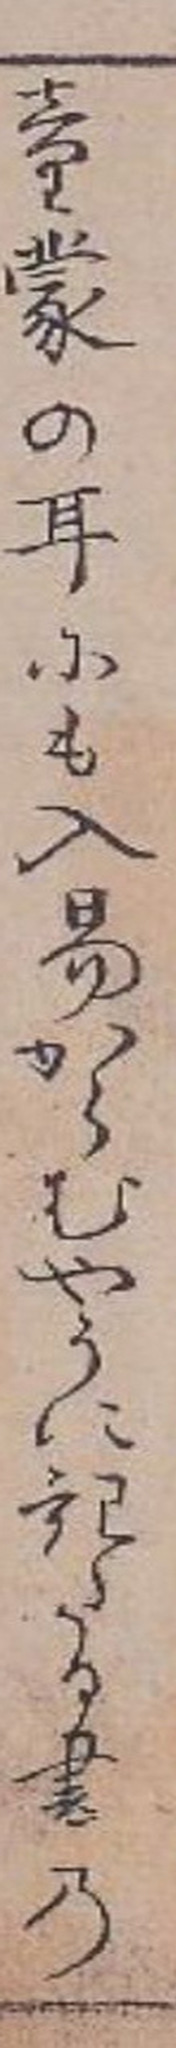童蒙の耳にも入易からむやうに記たる書の
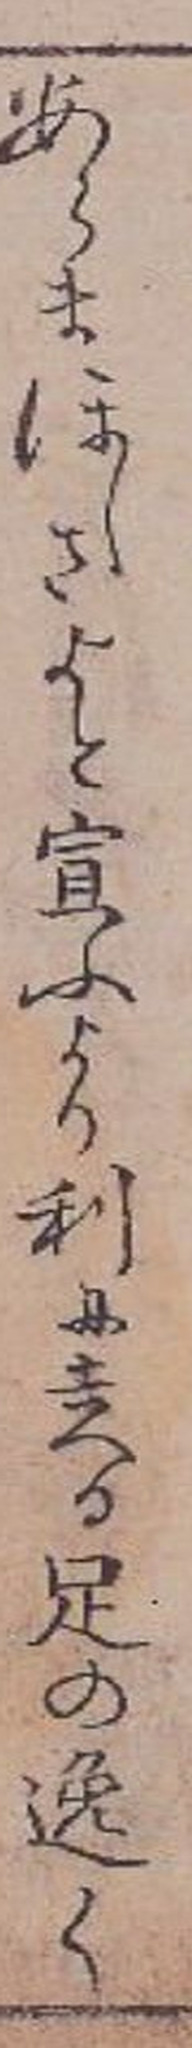あらまほしさよと宣ふより利に走る足の逸く
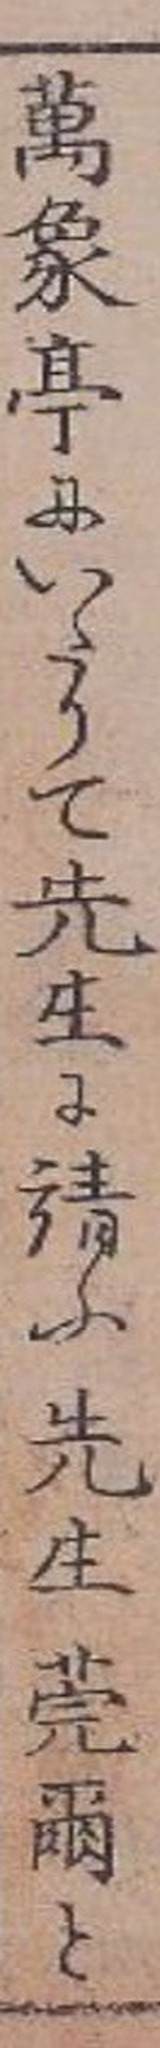万象亭にいたりて先生に請ふ先生莞爾と

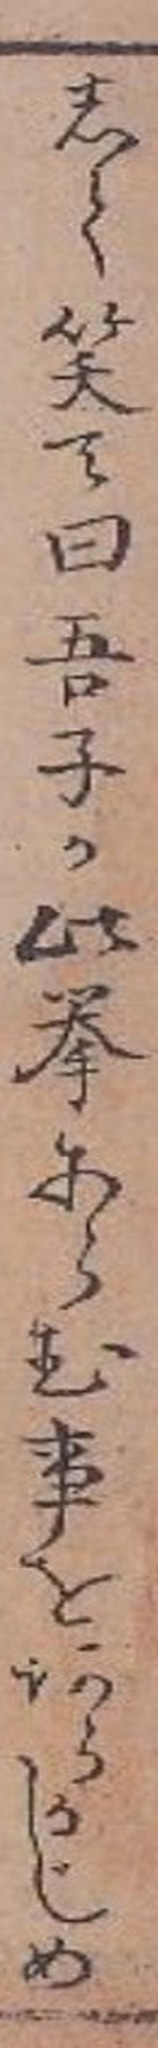して笑て曰吾子か此挙あらむ事をあらかじめ
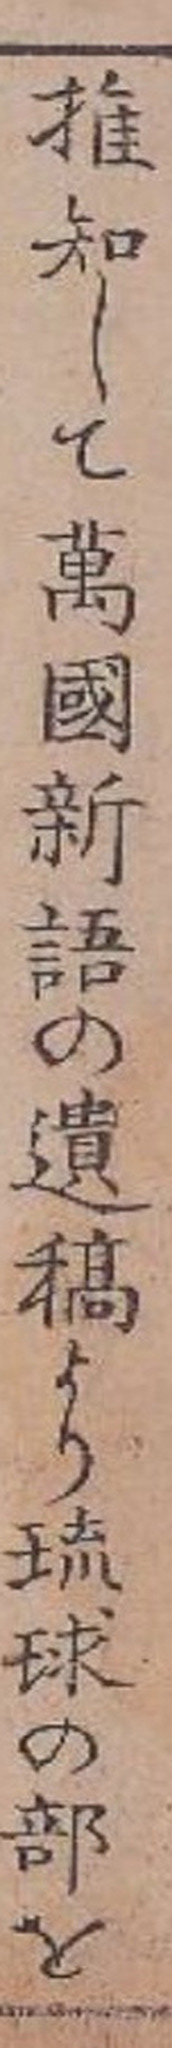推知して万国新語の遺稿より琉球の部を
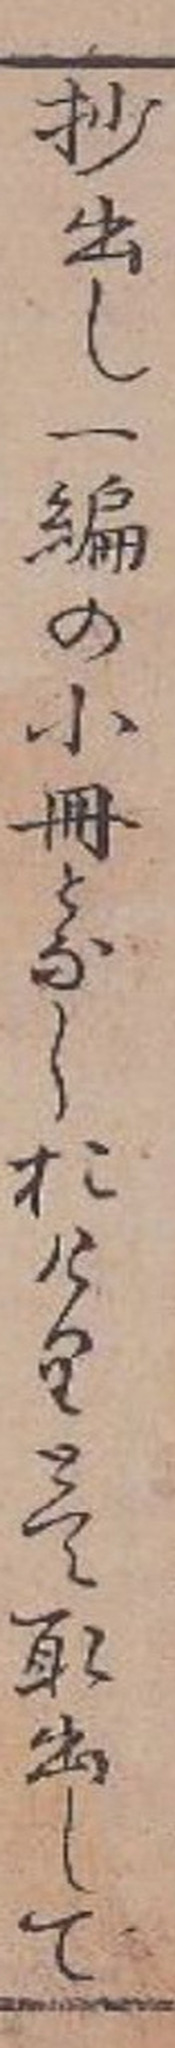抄出し一編の小冊となしおけりとて取出して
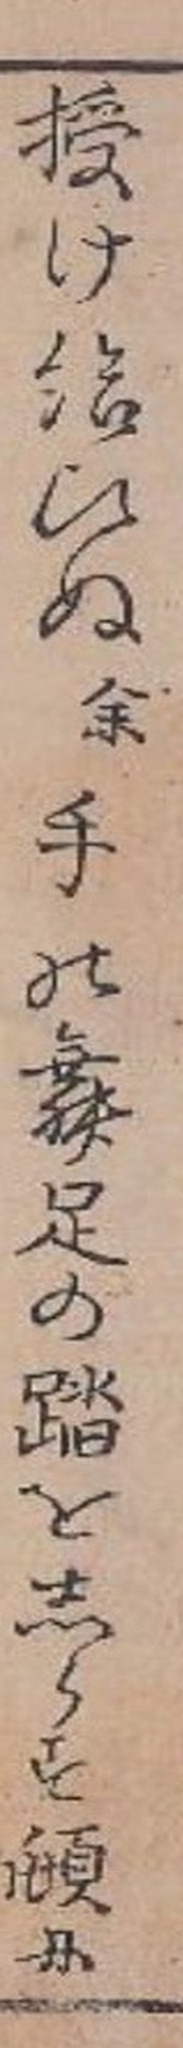授け給ひぬ余手の舞足の踏をしらす頓に
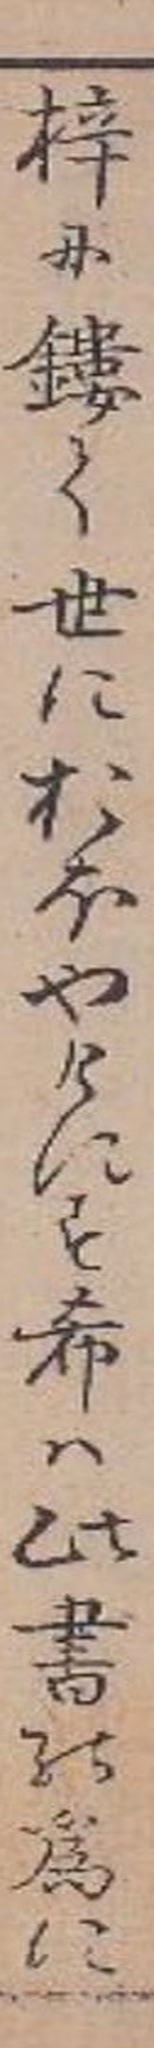梓に鏤て世におほやけにす希は此書の為に
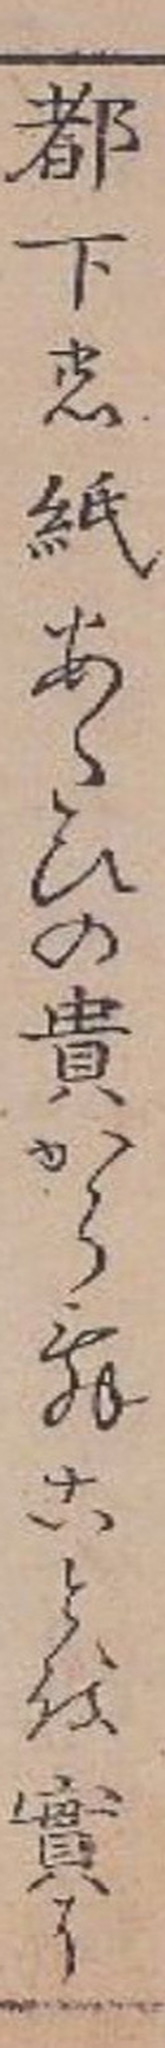都下の紙あたひの貴からむことを実に
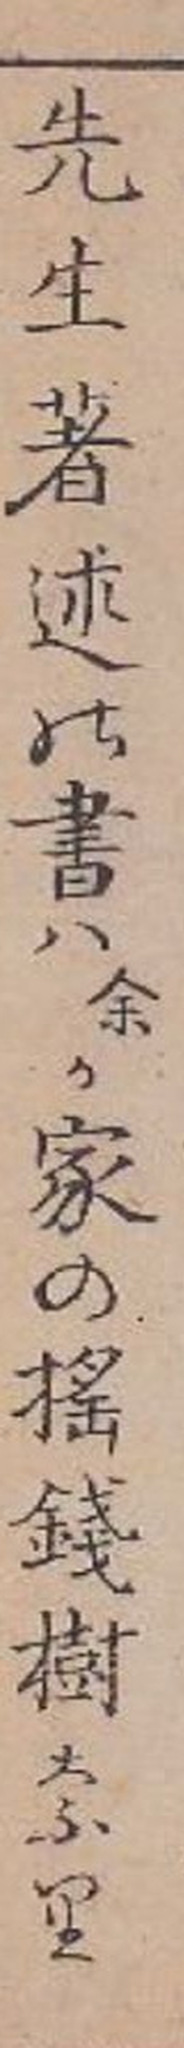先生著述の書は余か家の揺錢樹なり
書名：琉球談
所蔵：University of the Ryukyus Library
